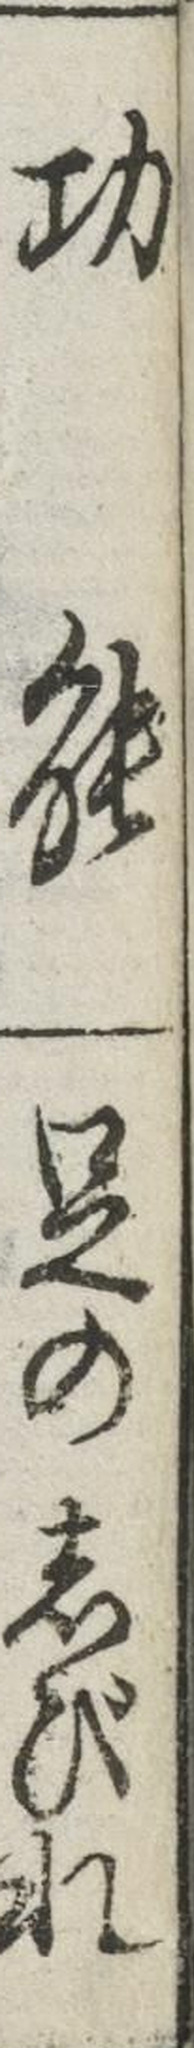功能足のしびれ
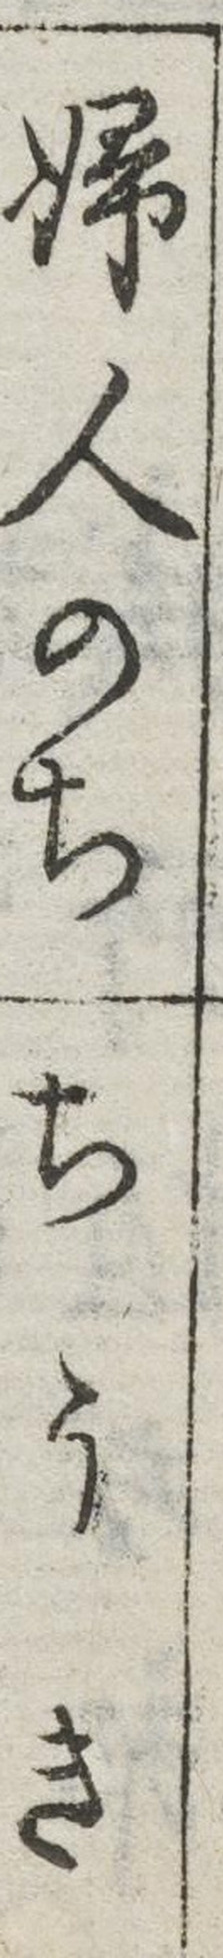婦人のちちうき
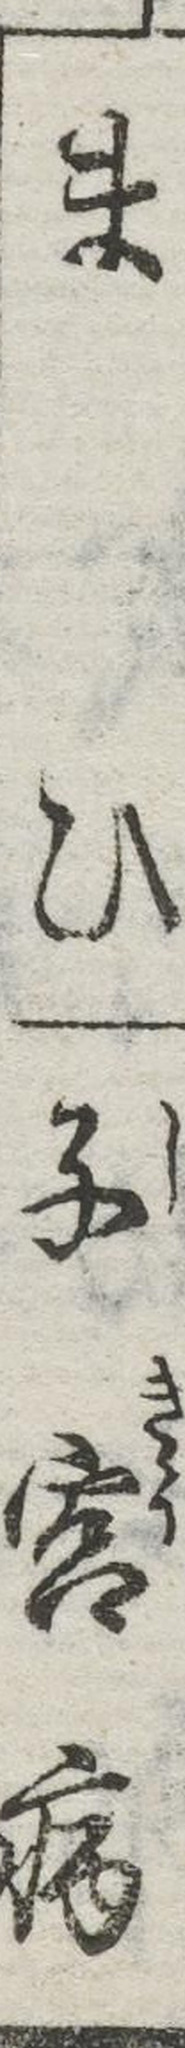まひ子宮病
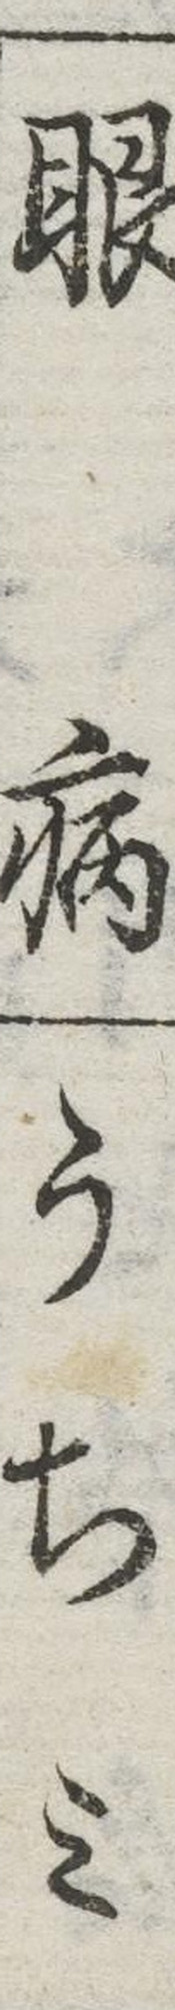眼病うちみ
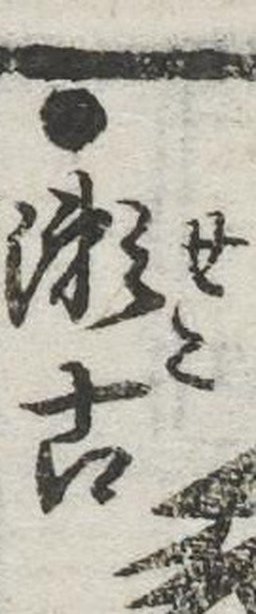●瀬古
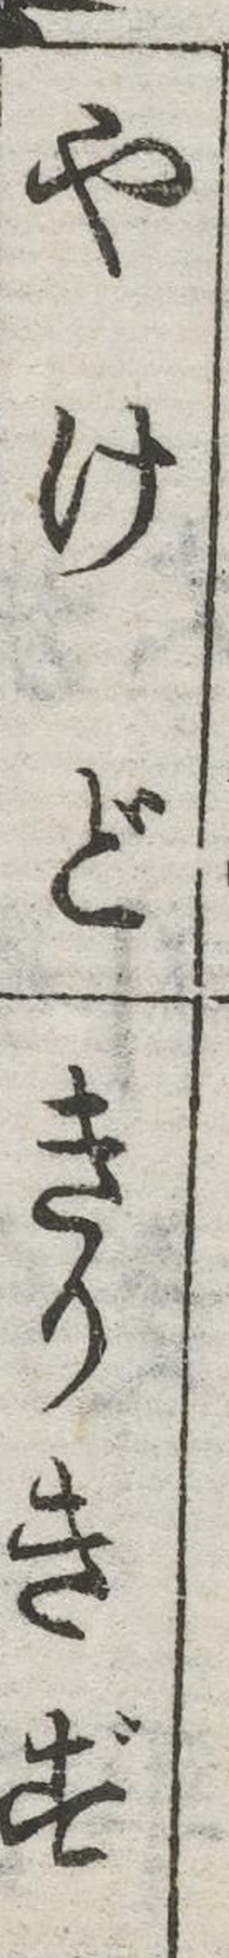やけどきりきず
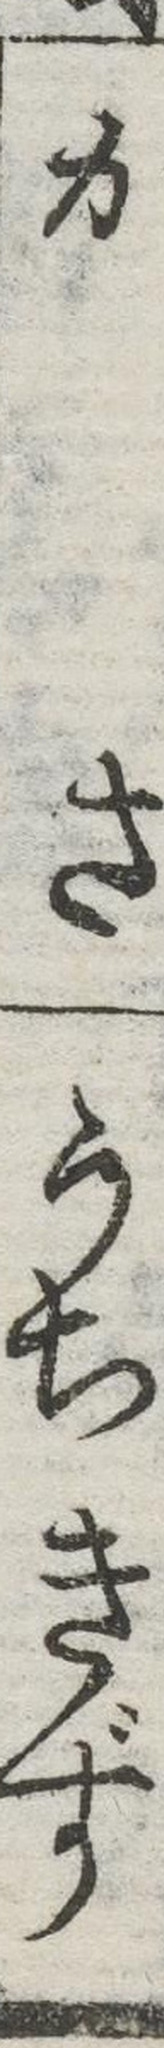かさうちきず
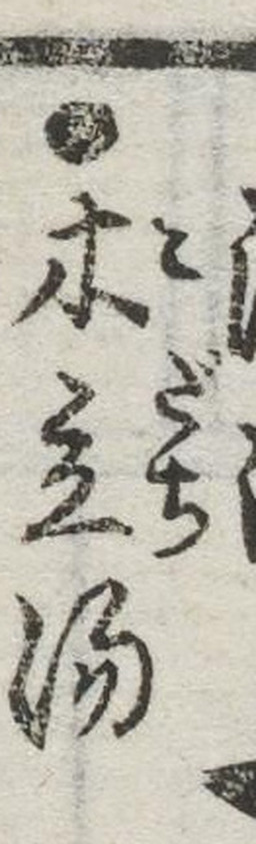●木立湯
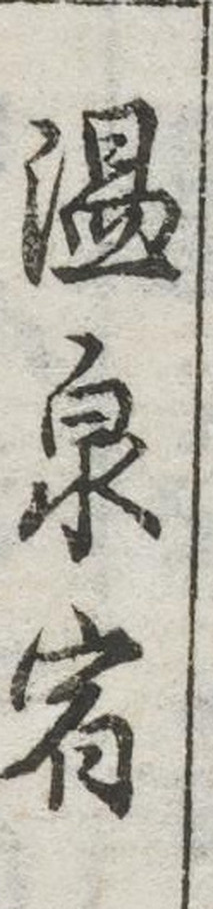温泉宿
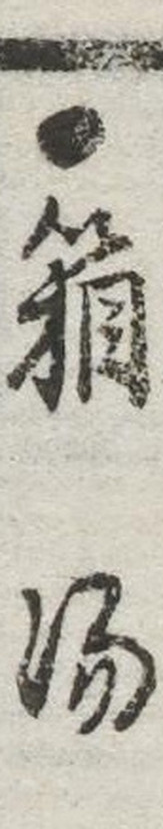●箱湯
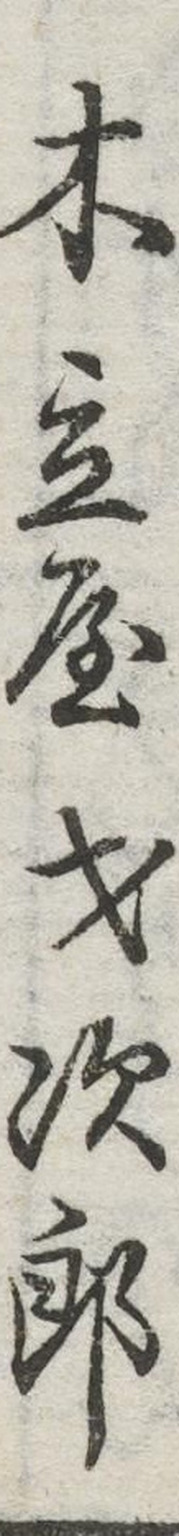木立屋才次郎
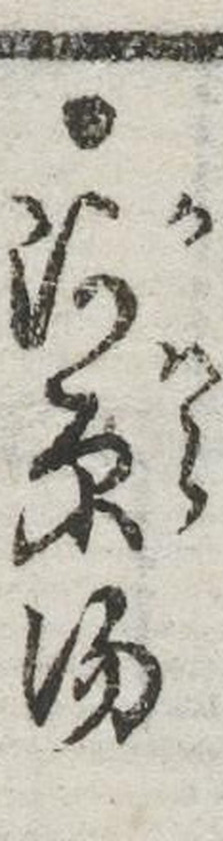●河原湯
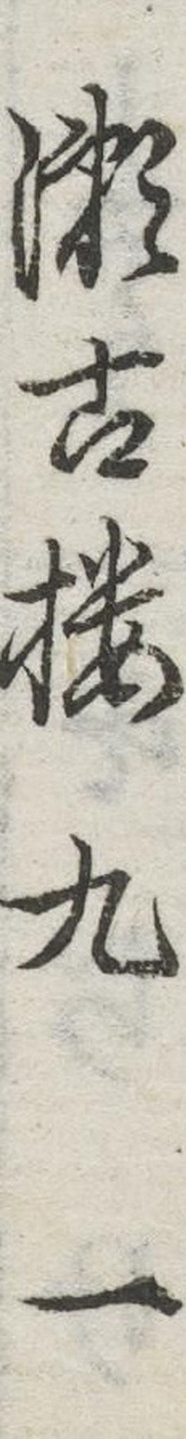瀬古楼九一
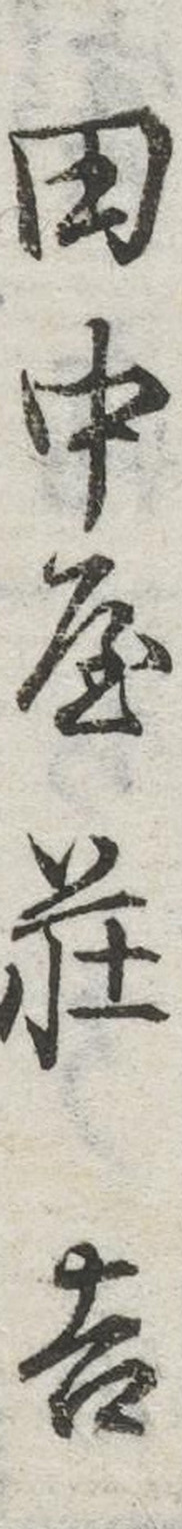田中屋荘吉
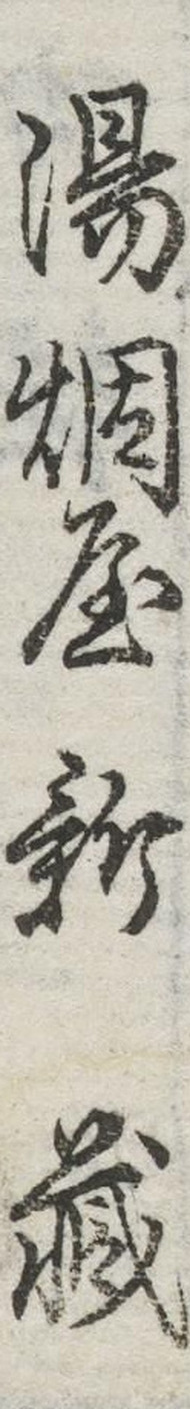湯烟屋新蔵
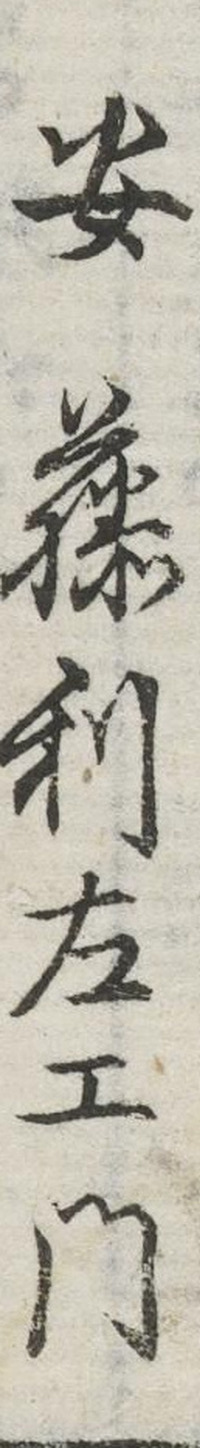安藤利左エ門
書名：諸國温泉遊覽記　全
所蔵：東京大学地震研究所図書室 Earthquake Research Institute Library, The University of Tokyo, JAPAN
